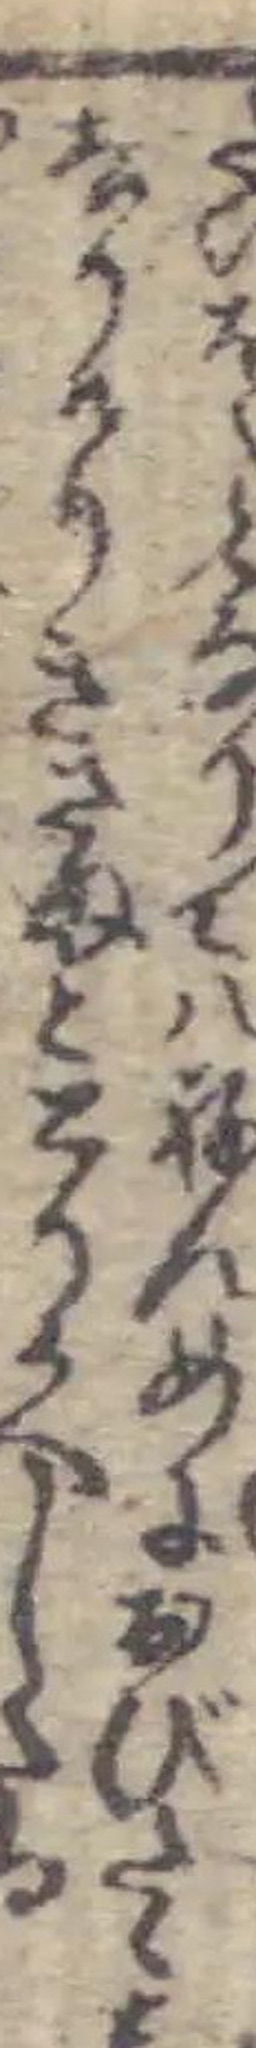なりけりきさまととりかへしたる
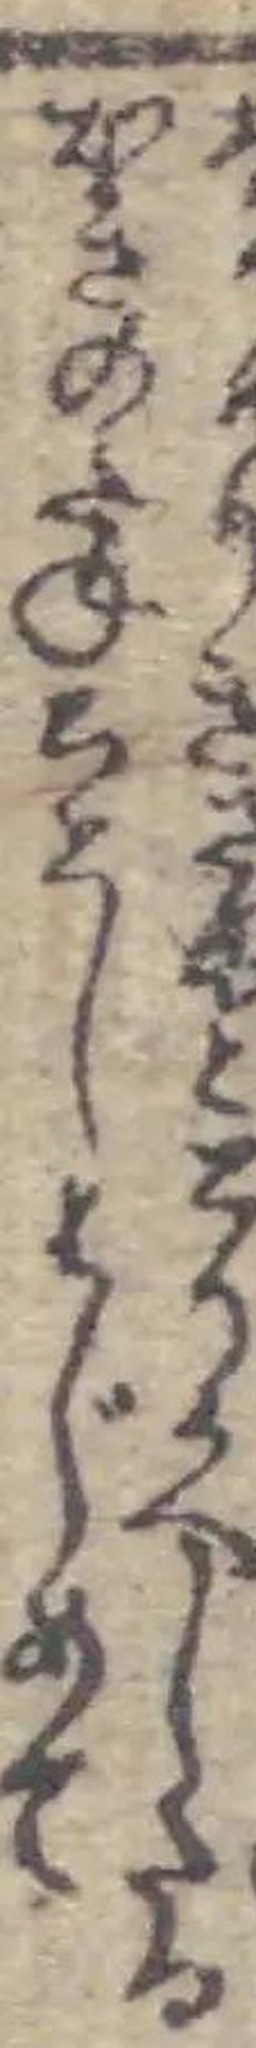かきのたねことしはじめて
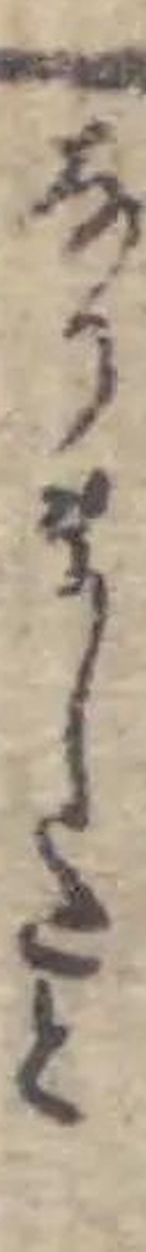なりましたと
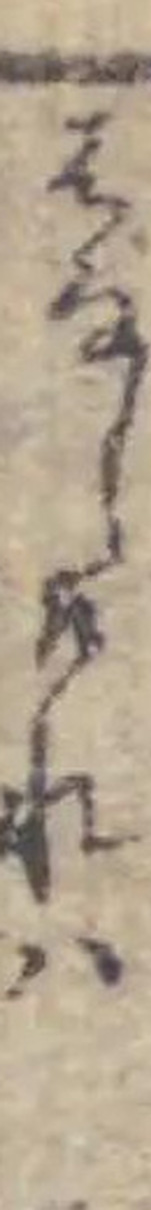はなしけれは
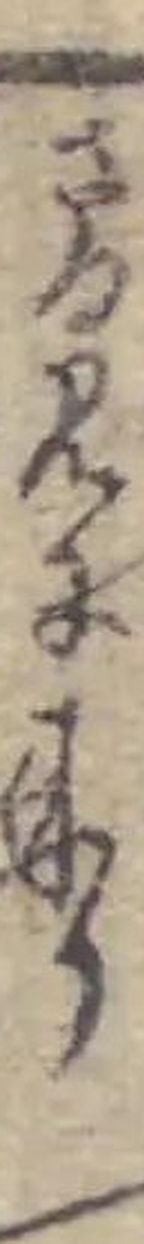さる見に来り
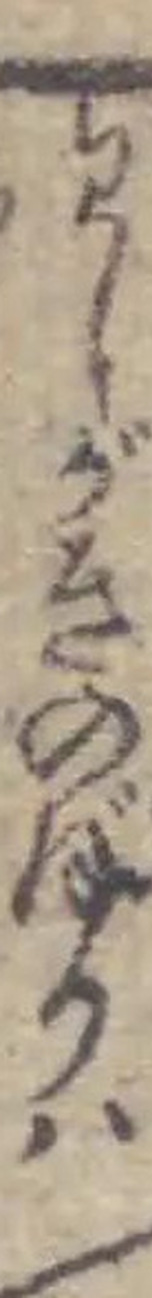わしがきのぼりは
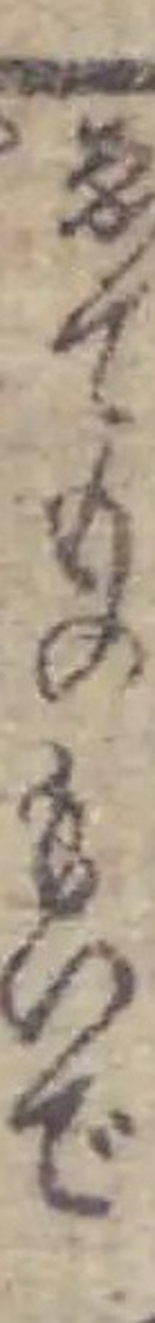ゑてものもいで
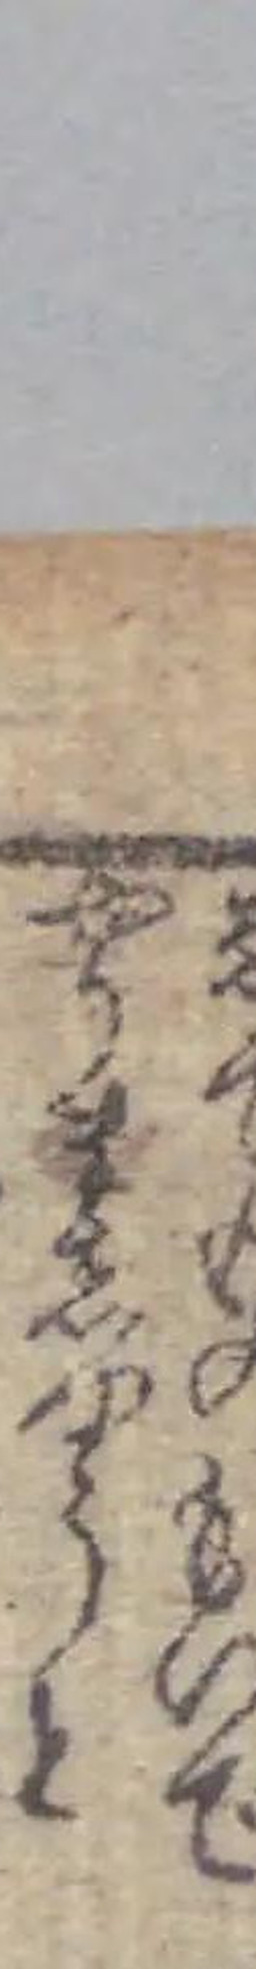やりましやうと
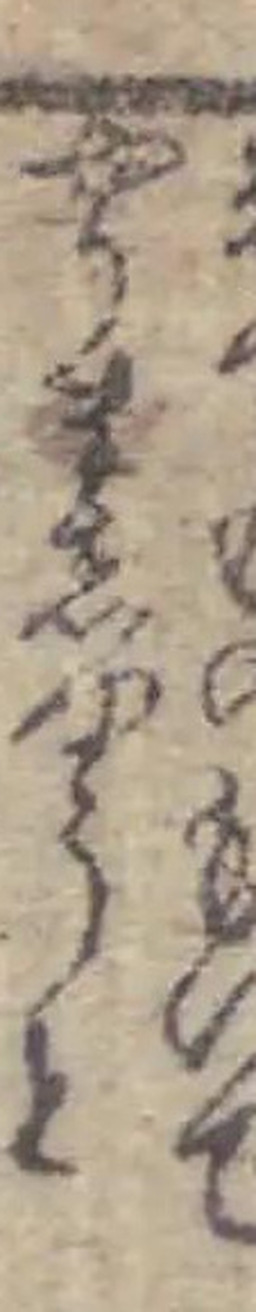やりましやうと
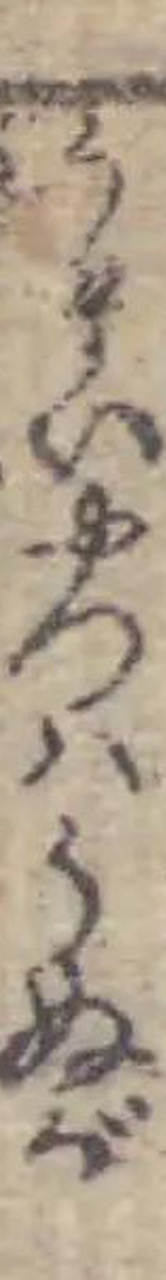うまいやつはうぬが
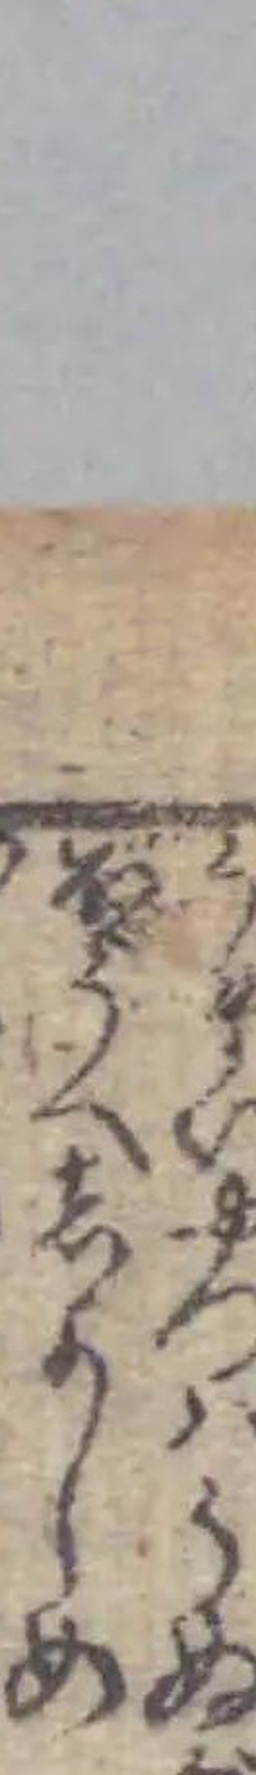ほうへしよしめ
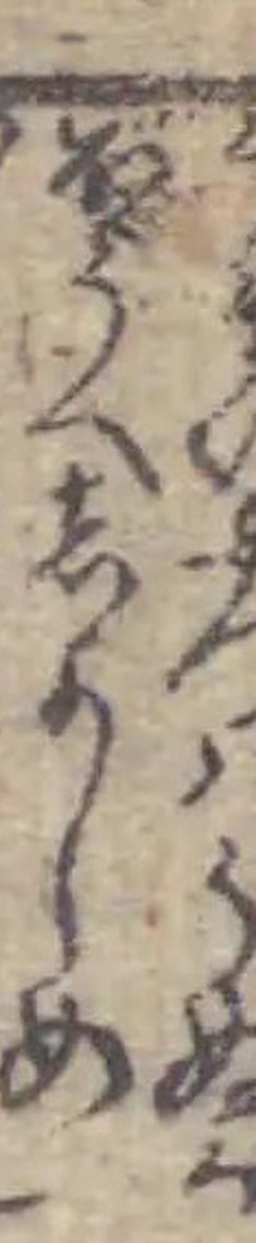ほうへしよしめ
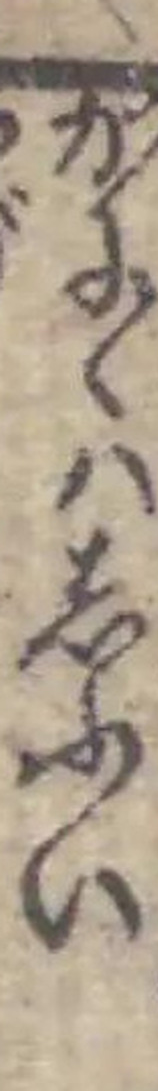かにゝはしふい
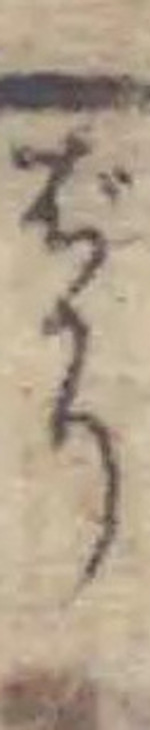ばかり
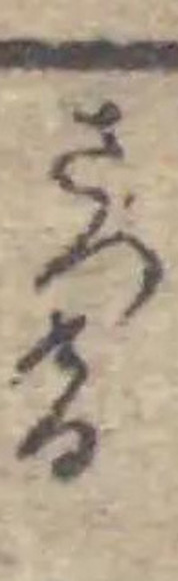さつける

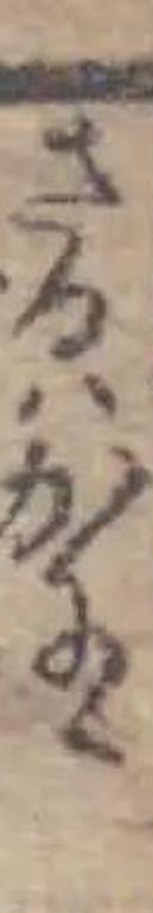さるはかにゝ
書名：蟹牛房挟多 3巻
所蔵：国立国会図書館 National Diet Library, JAPAN
